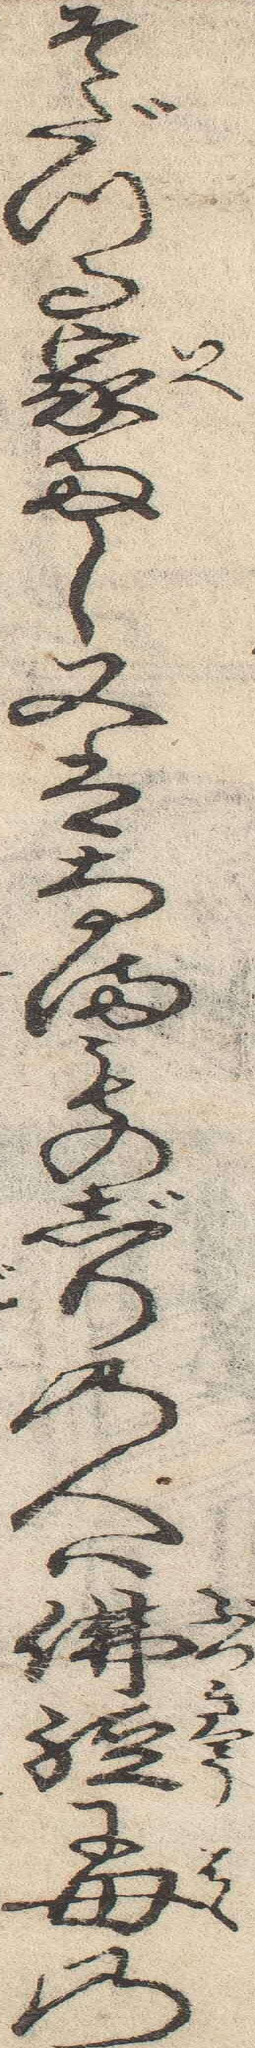そだつる家多し又はなまものじりの人は佛経に母の
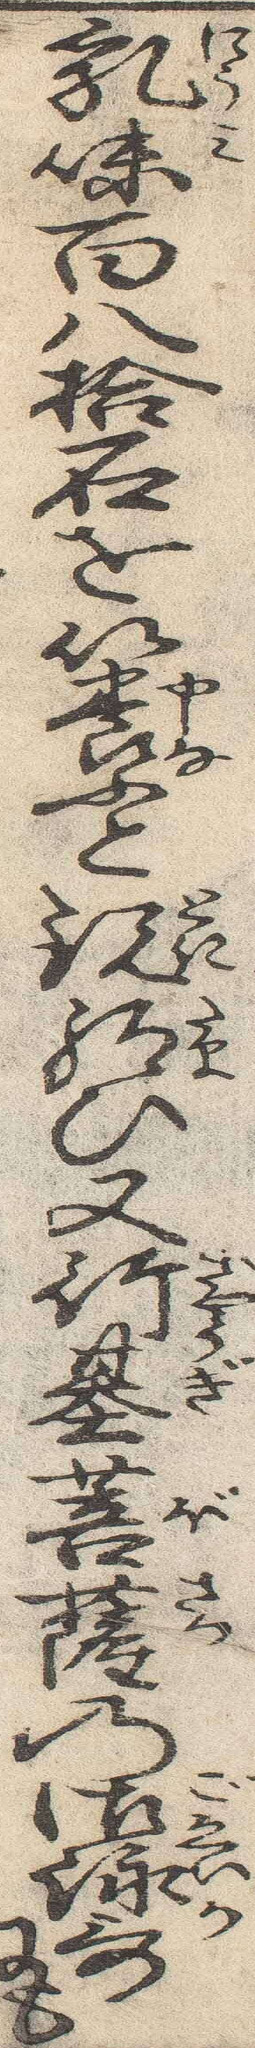乳味百八拾石を以養ふと説給ひ又行基菩薩の御詠哥にも
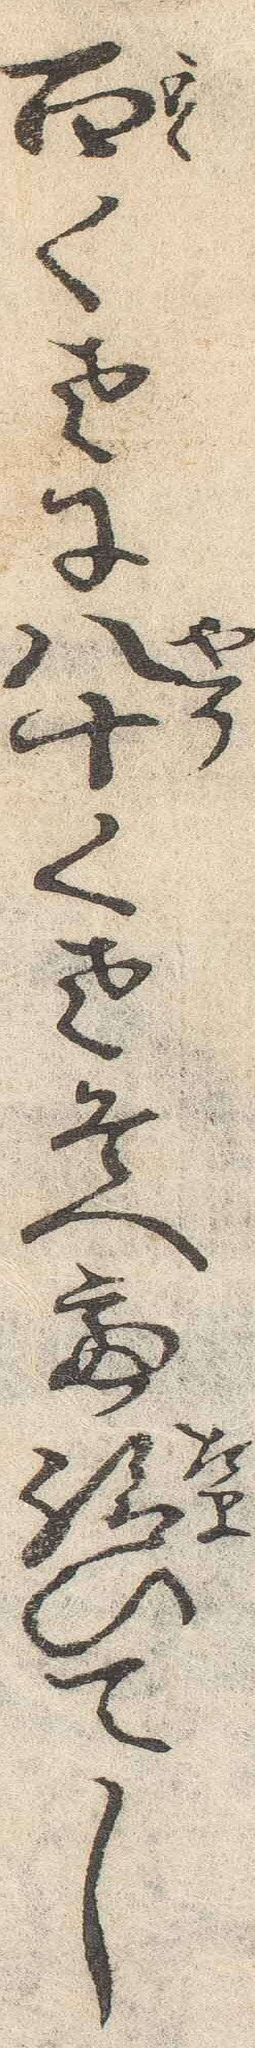百くさに八十くさそへて給ひてし
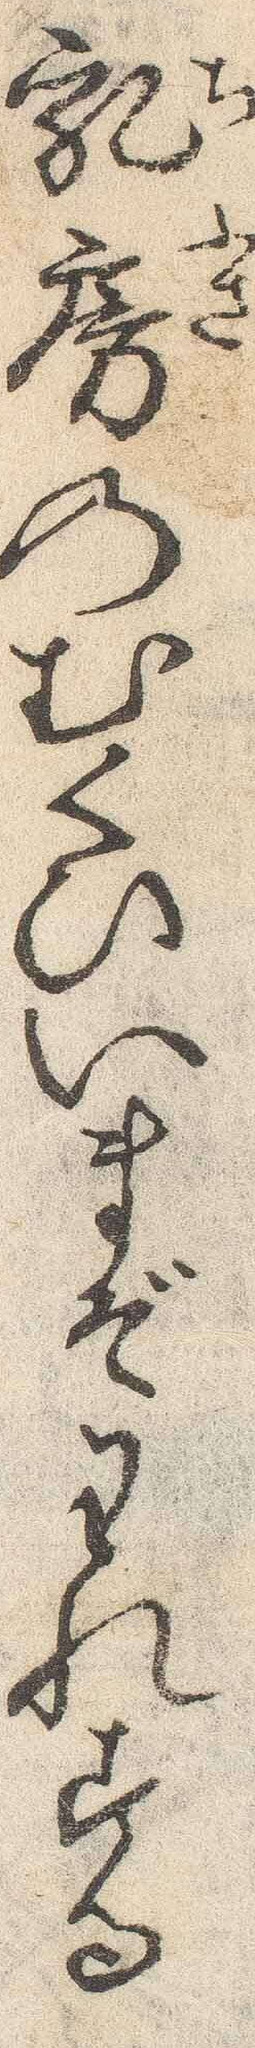乳房のむくひいまぞわれする
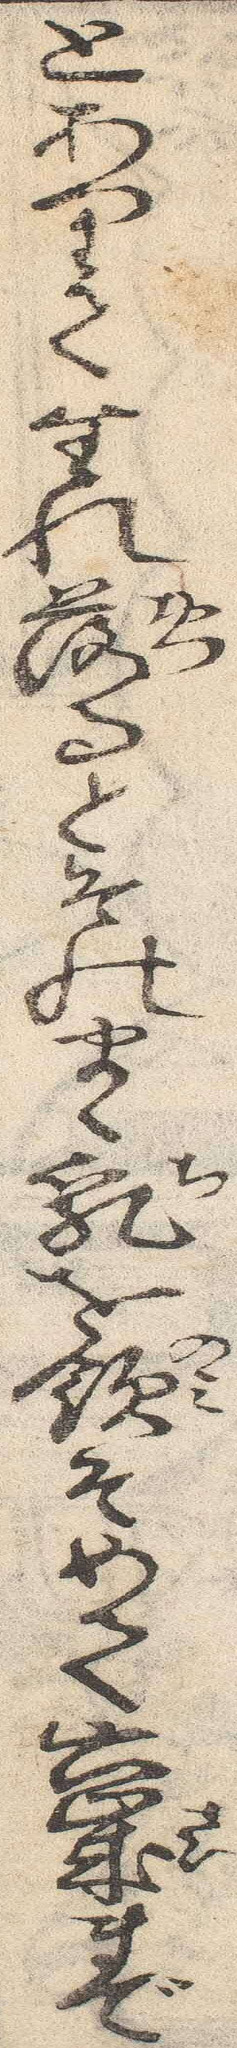とありて生れ落るとそのまゝ乳を飲そめて六歳まで
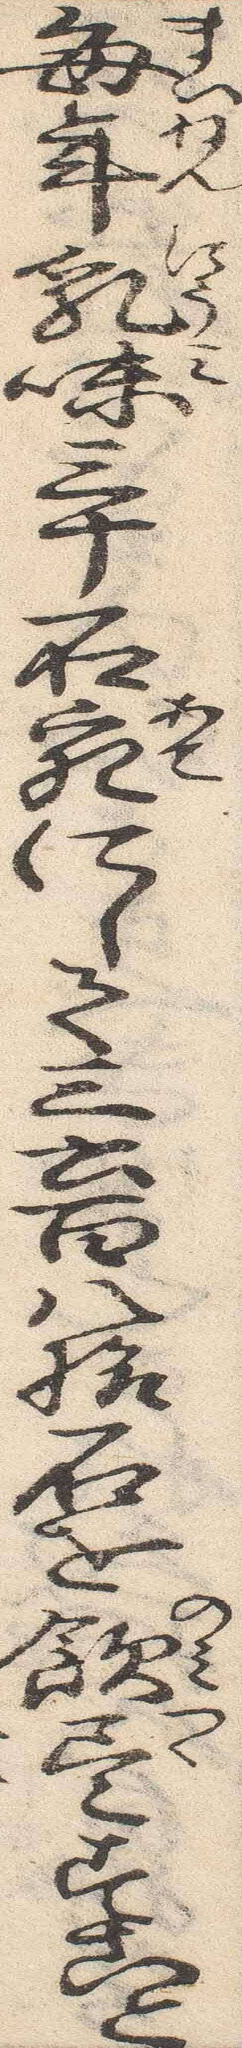毎年乳味三十石宛にして三六百八拾石を飲盡すこと
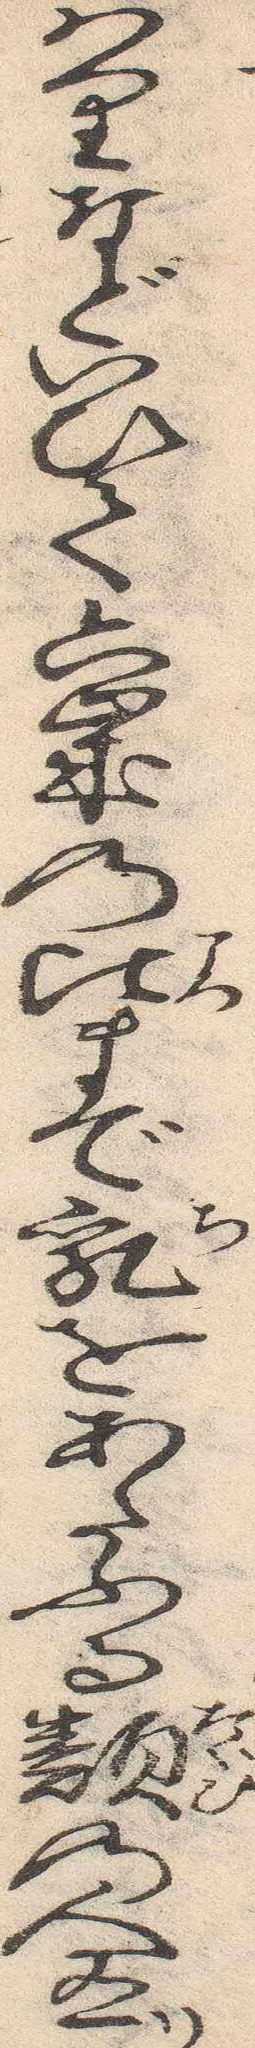はりなどいひて六歳の比まで乳をあたふる類の人在り
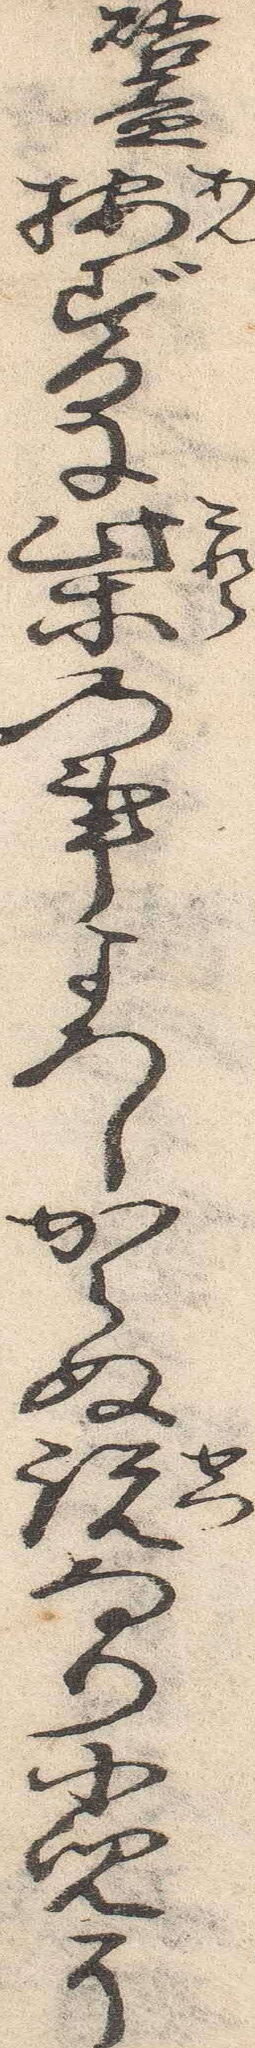啓益按ずるに此等の事よろしからぬ説なり小児に
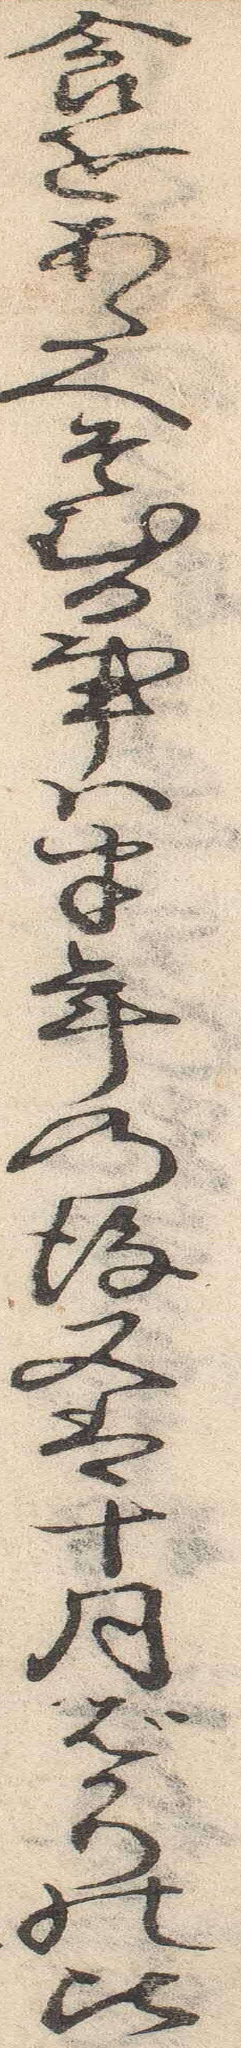食をあたへそむる事は半年の後又は十月ばかりの比
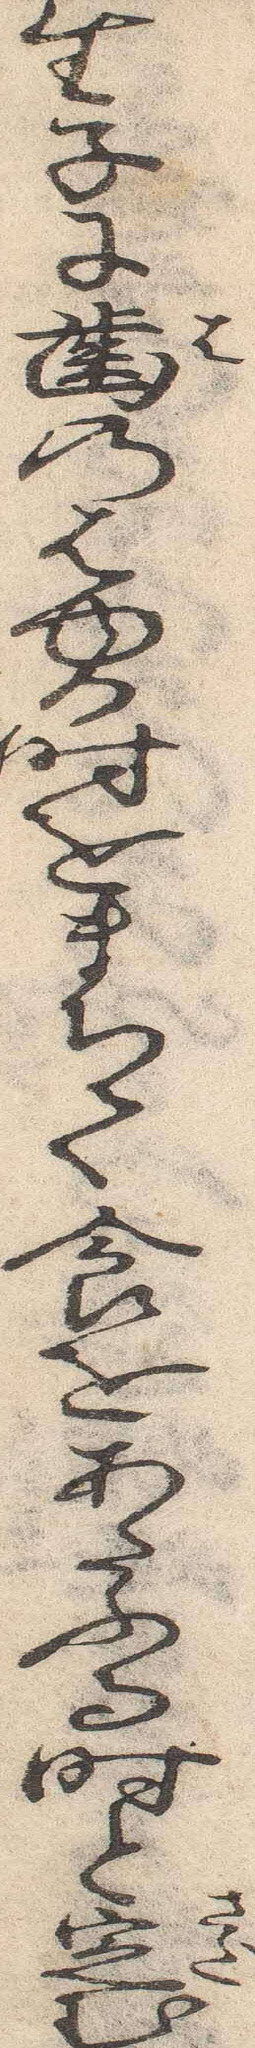生子に歯のはゆる時をまちて食をあたふる時と定む
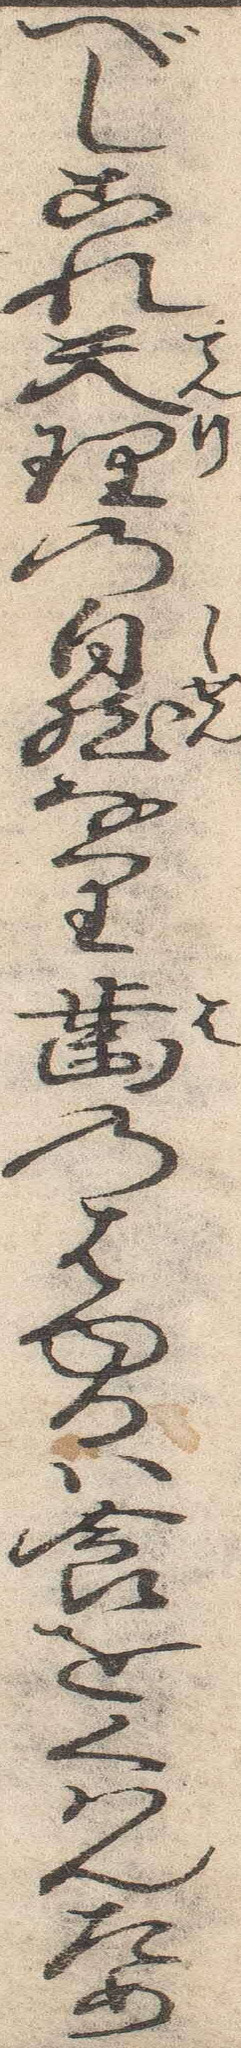べしこれ天理の自然なり歯のはゆるは食をくわんため
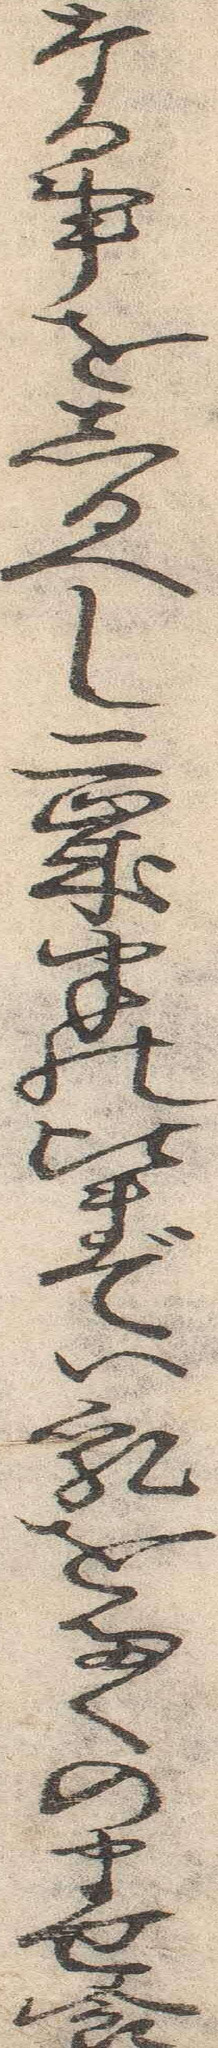なる事をしるへし二歳半の比までは乳を多くのませ食
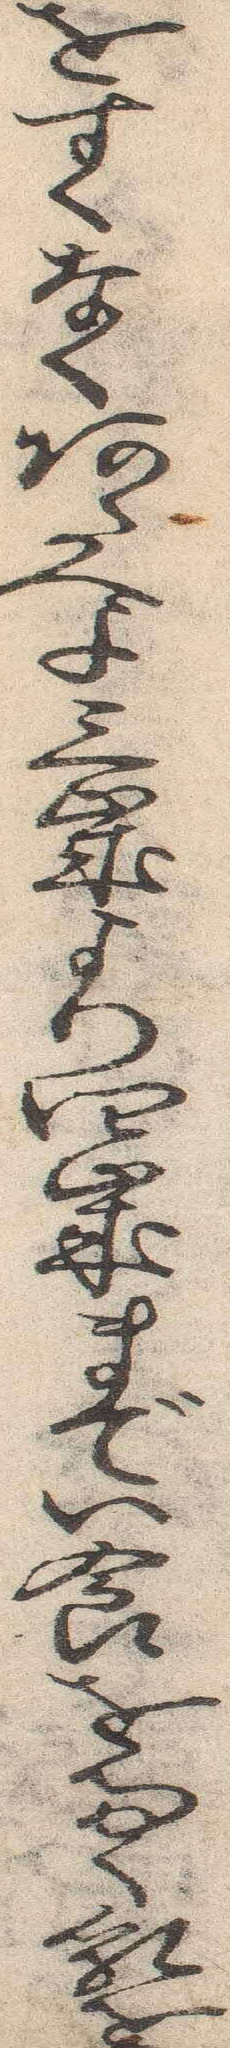をすくなくあたへよ三歳より四歳までは食を多く乳を
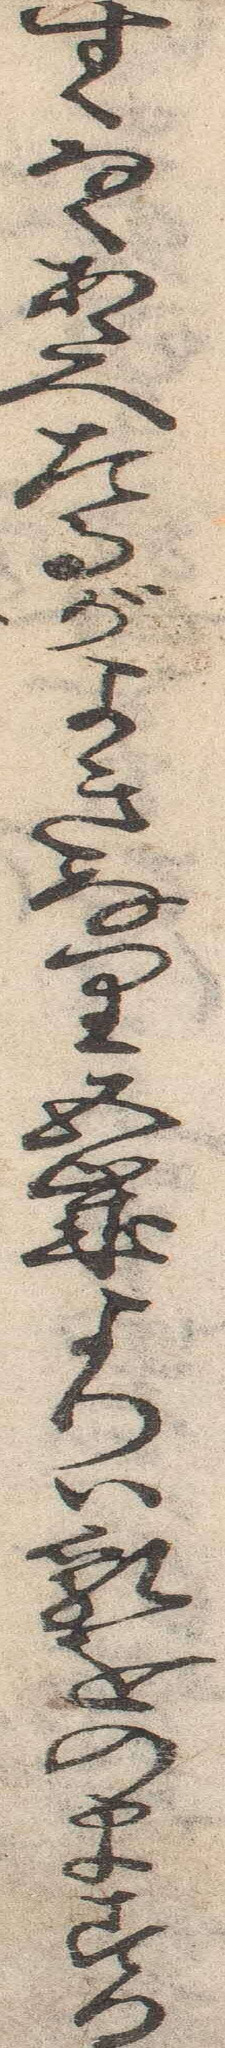すくなくあたへたるがよきなり五歳よりは乳をのまする
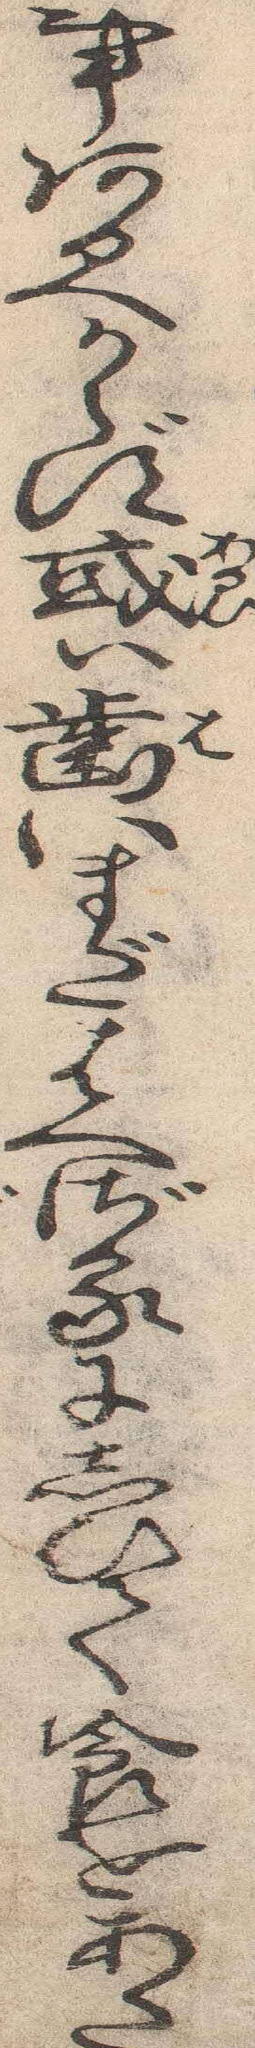事あるへからず或は歯いまだはへざるにしひて食をあた
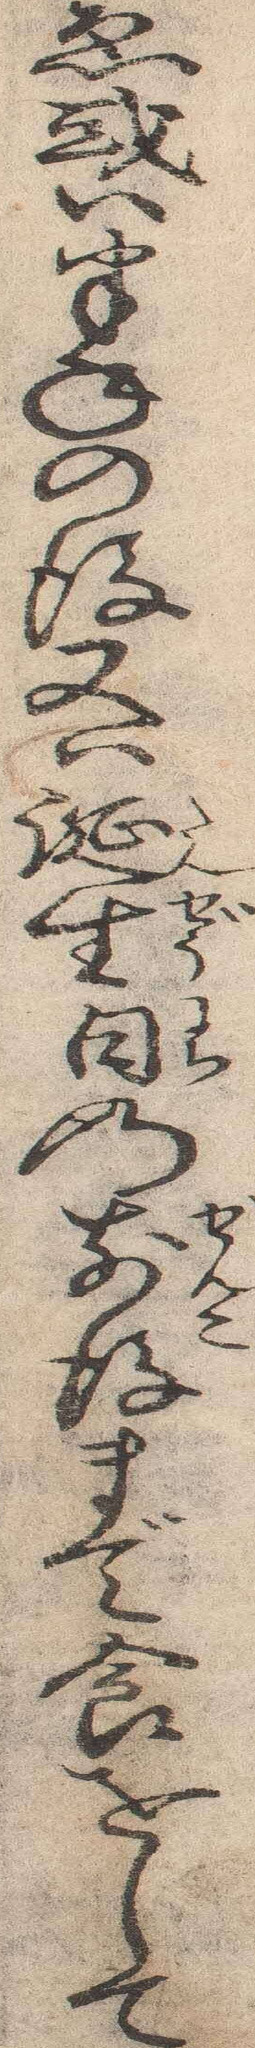ゑ或は半年の後又は誕生日の前後まで食をして
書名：小児必用養育草
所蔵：東京学芸大学附属図書館 国文学研究資料館
